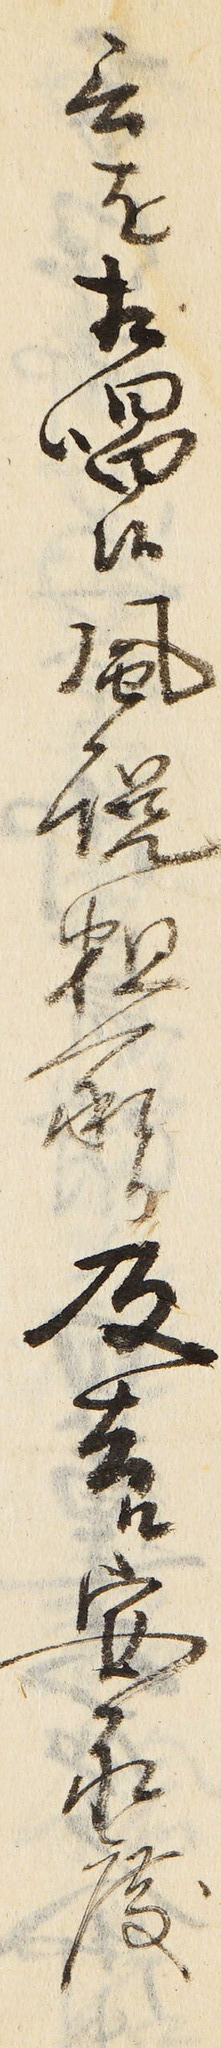言を相唱候風説粗承り及去る安永度
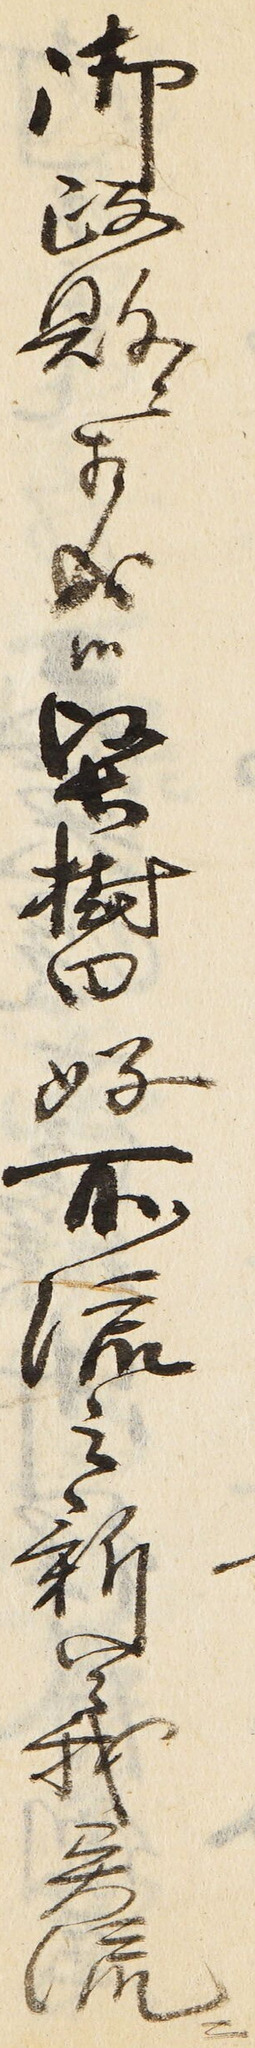御政敗に相成候堅樹日好所流之新義異流に
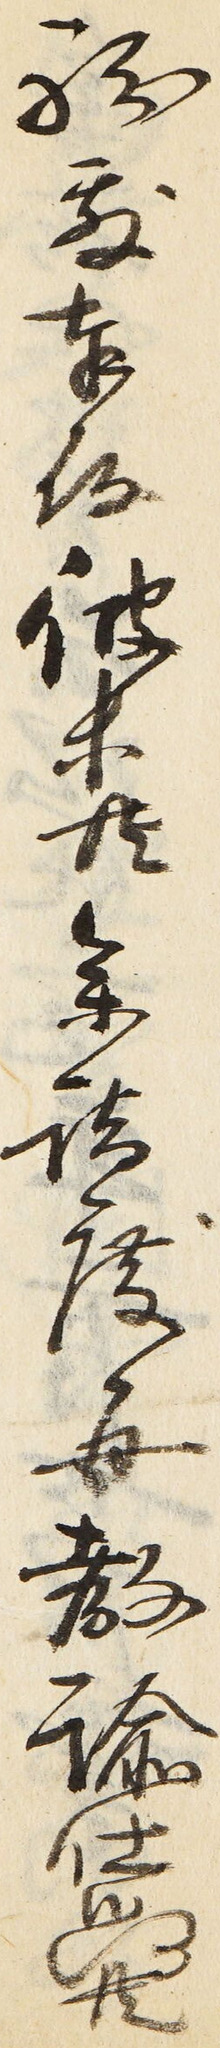紛敷奉存彼等共参詣度毎教諭仕候得共
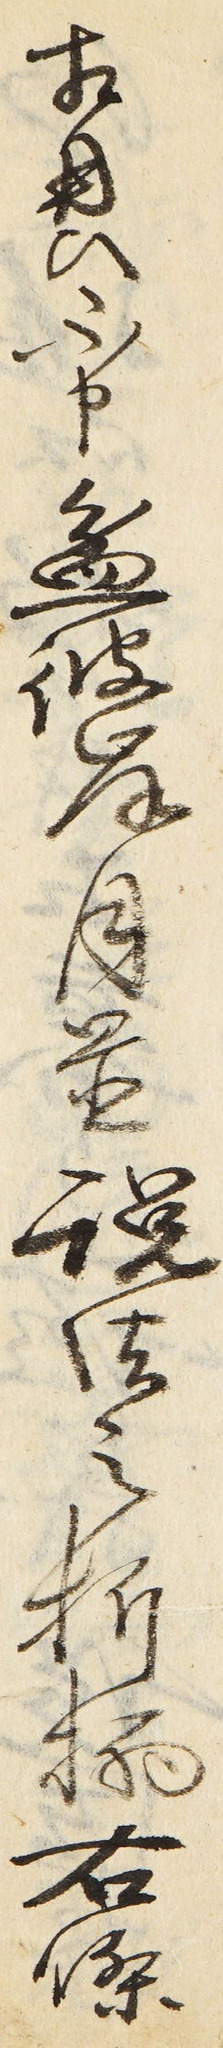相用ひ不申盆彼岸月並説法之折柄右條
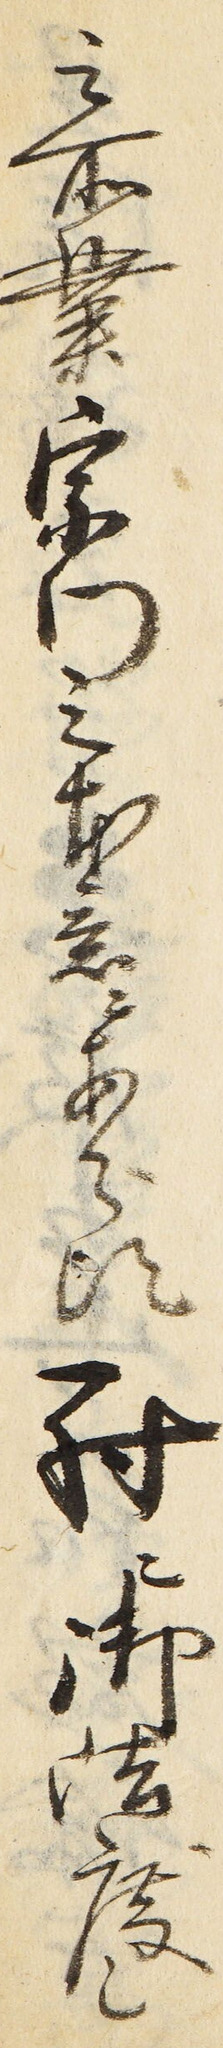之所業宗門之本意にあらす殊に御法度之

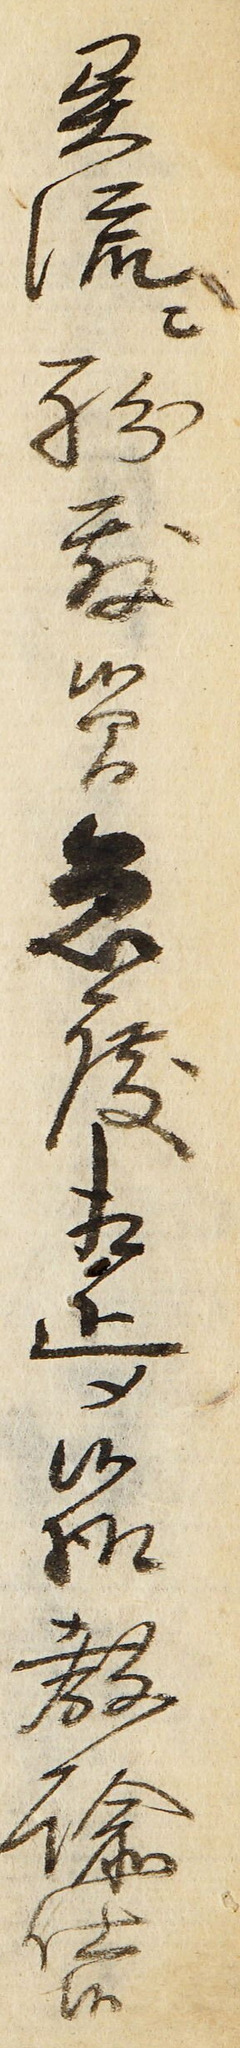異流に紛敷候間急度相止メ候様教諭仕候
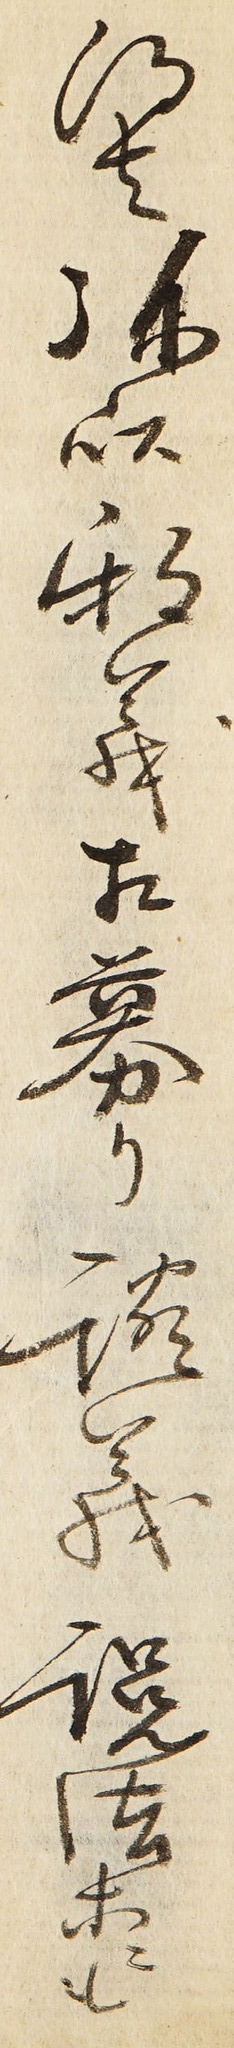得は弥以新義相募り談義説法等にも
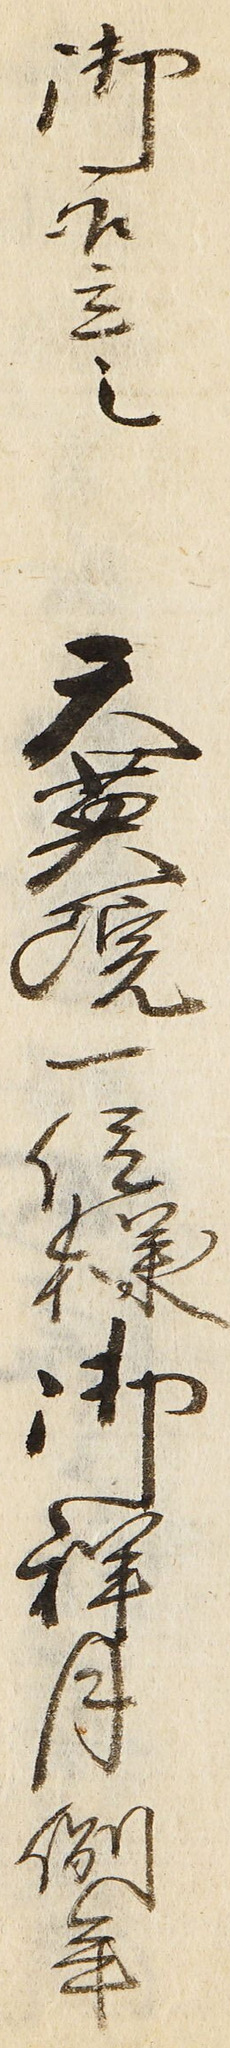御取立之天英院一位様御祥月例年
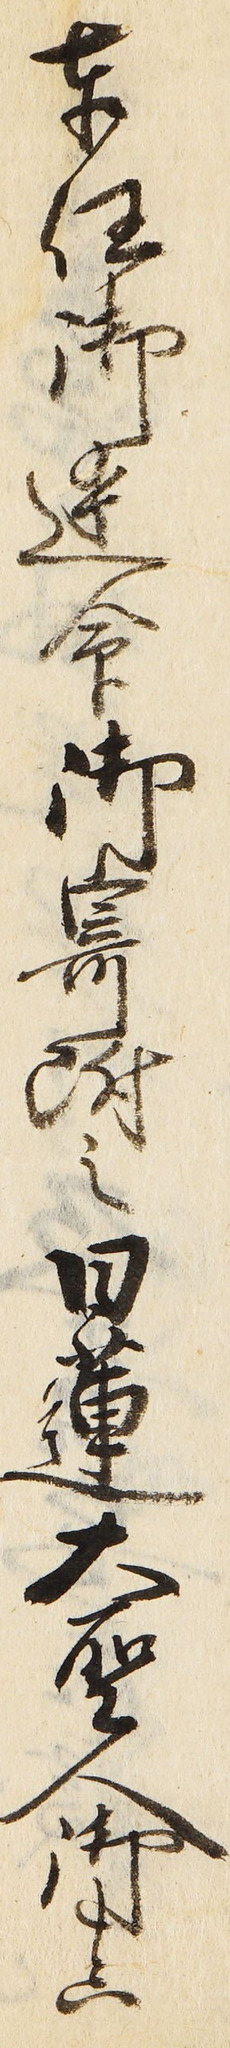奉任御遺命御寄附之日蓮大聖人御真
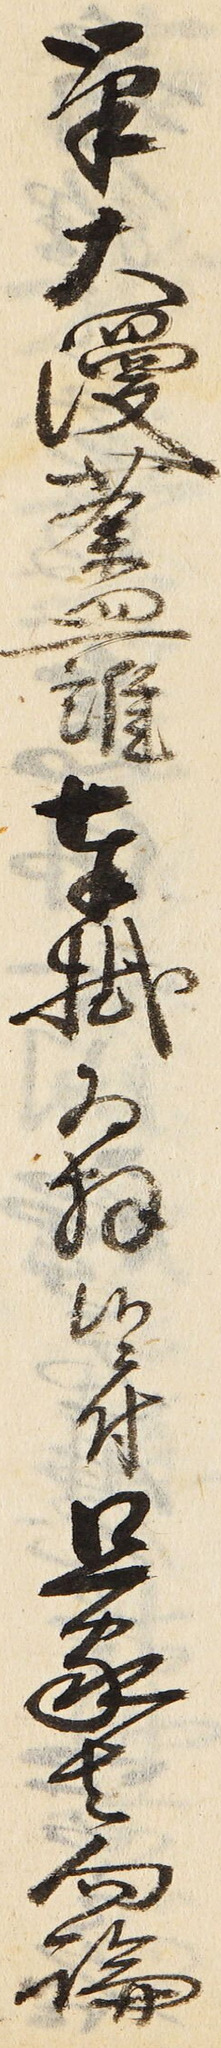筆大漫荼羅奉掛為拝候に付旦家は勿論
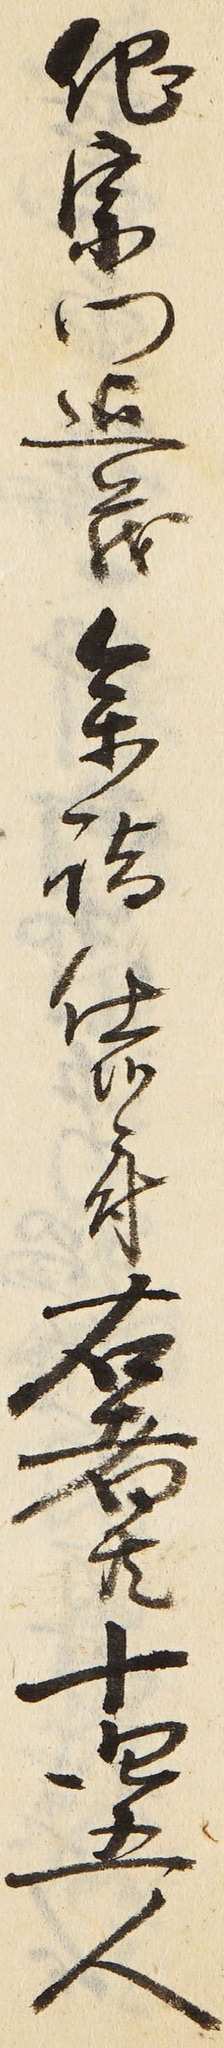他宗門迠も参詣仕候に付右者共十四五人
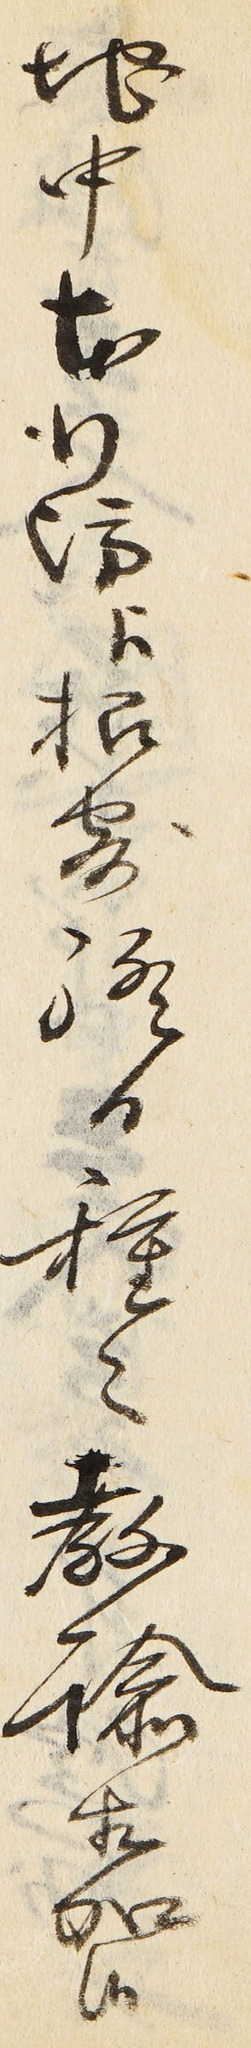地中本行坊江招寄終日種々教諭相加候
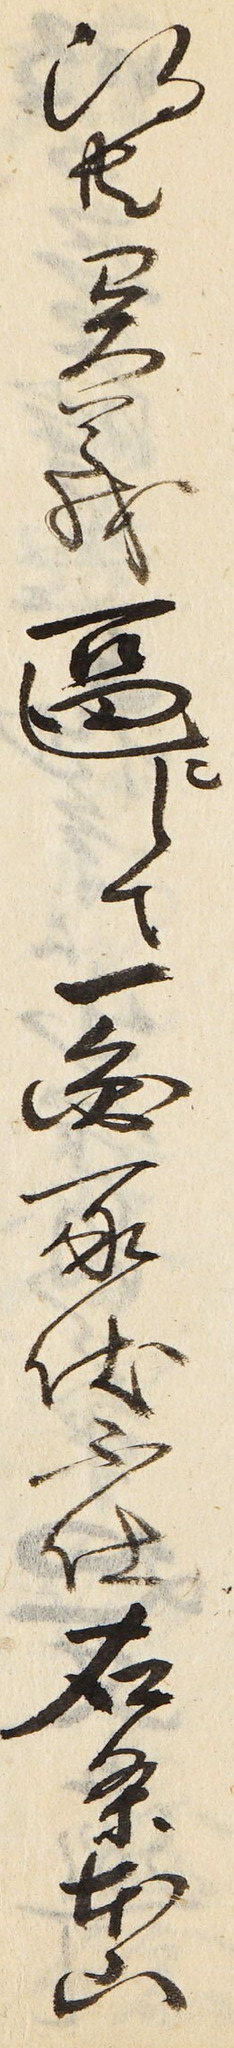得共異義区にして一円承伏不仕右条本山
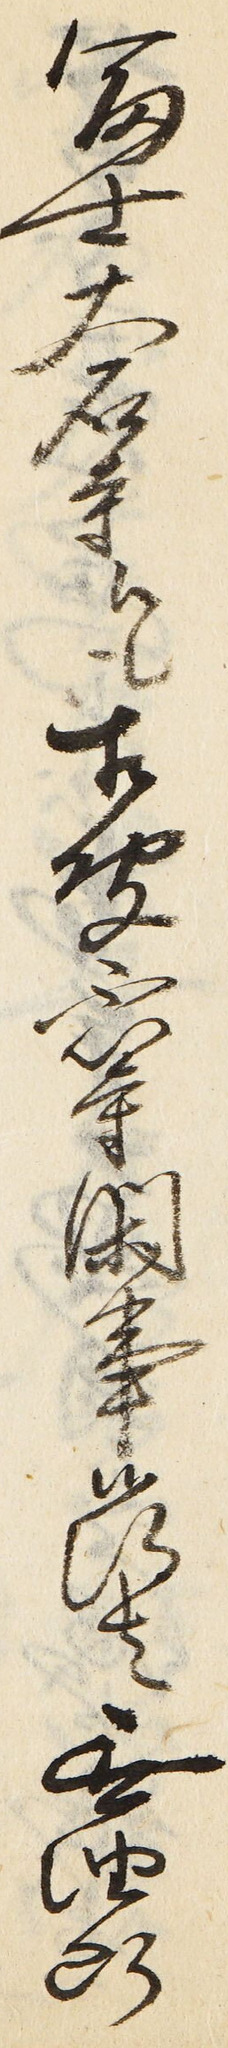富士大石寺江も相聞不等閑事候得は無油断
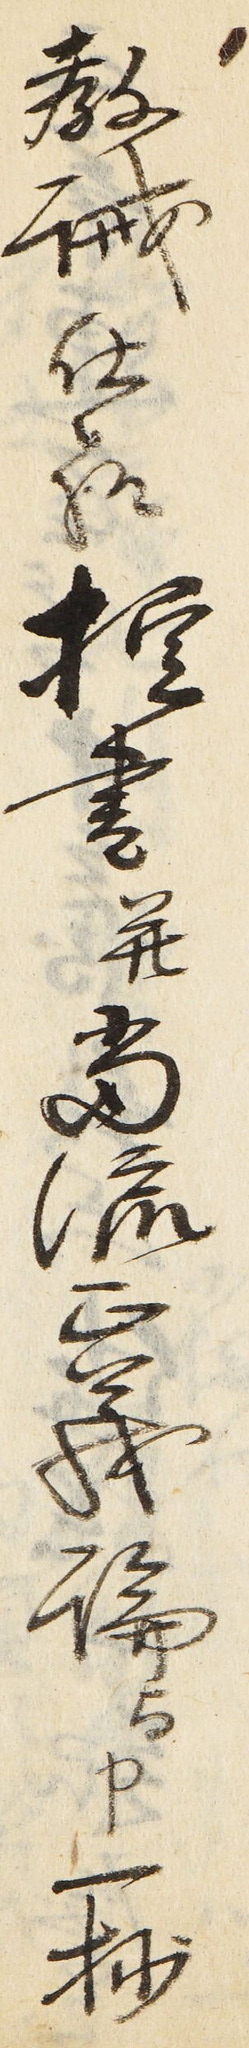教誡仕候様掟書并当流正義論と申一抄
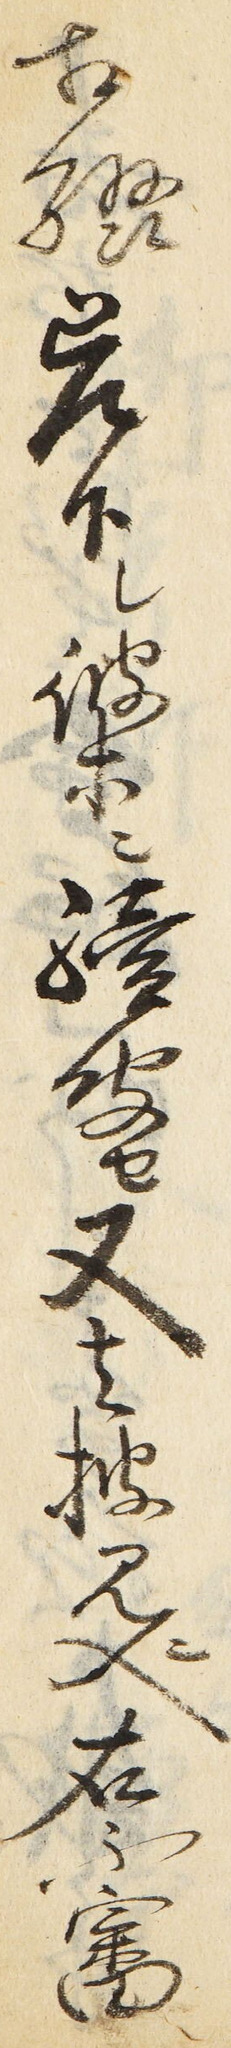相綴差下し彼等に読聞せ又は披見に入右不審
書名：異流一件日記
